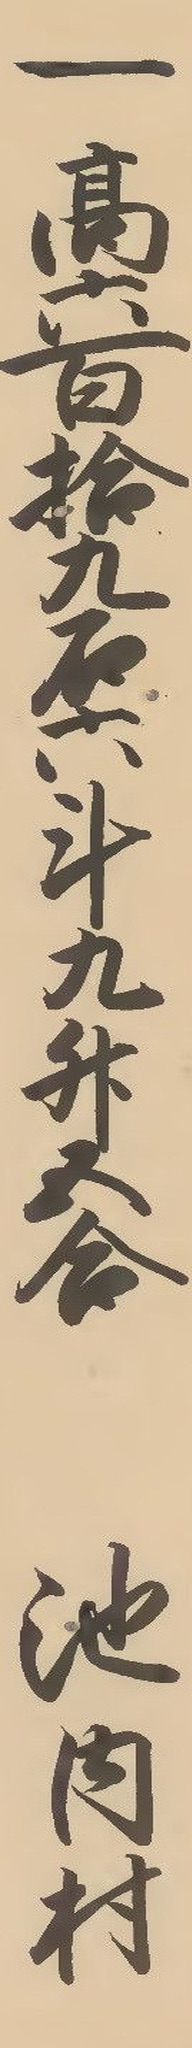一高六百拾九石六斗九升五合池内村
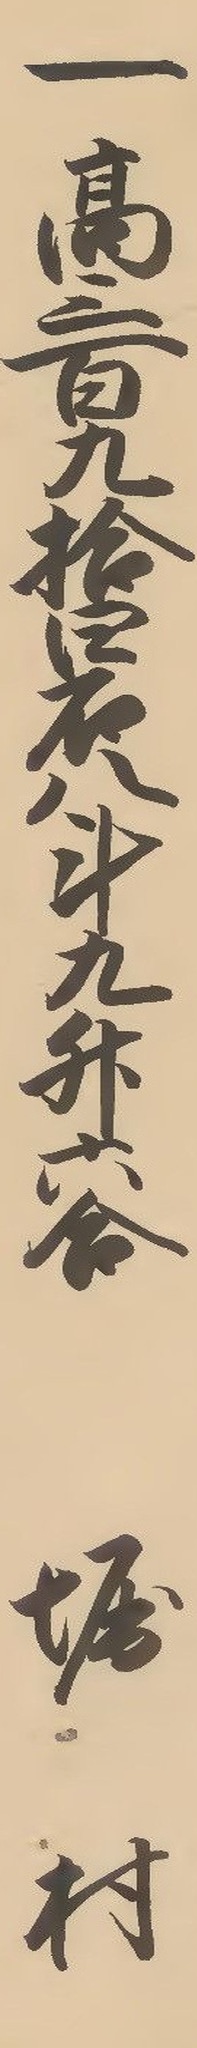一高三百九拾四石八斗九升六合堀村
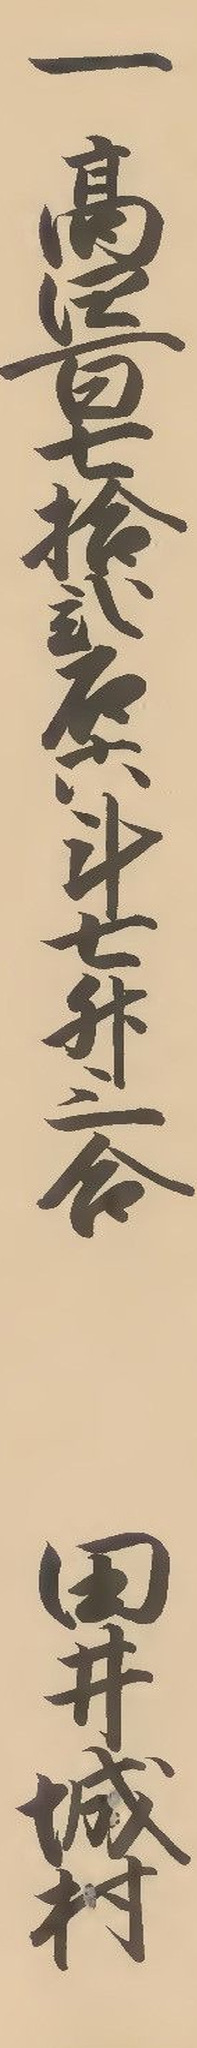一高四百七拾弐石六斗七升三合田井城村
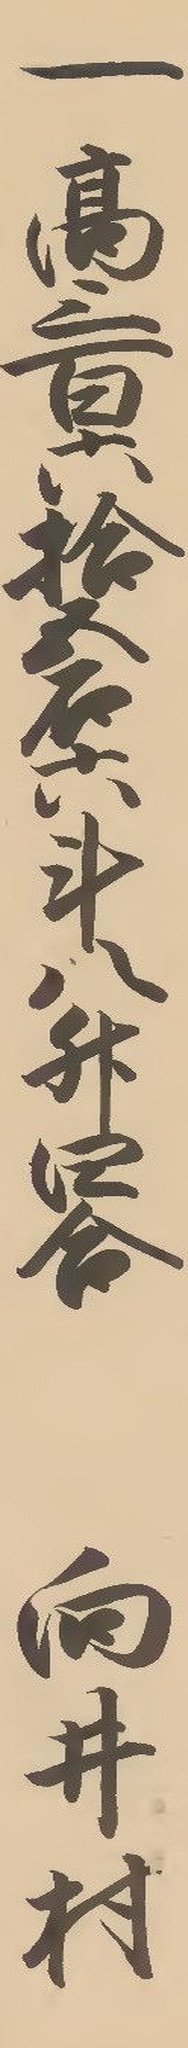一高三百六拾五石六斗八升四合向井村
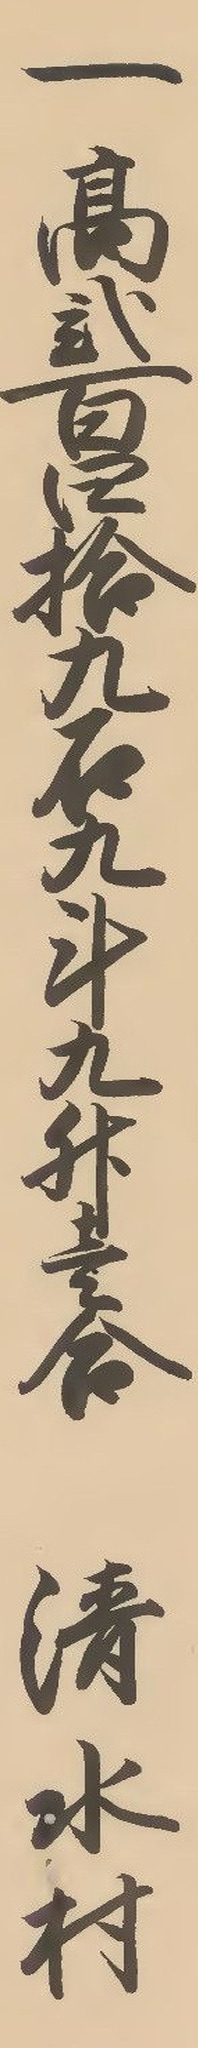一高弐百四拾九石九斗九升壱合清水村
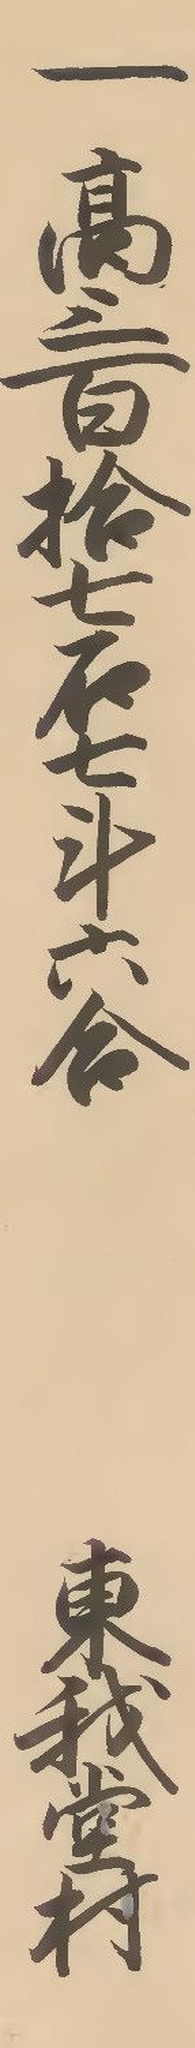一高三百拾七石七斗六合東我堂村
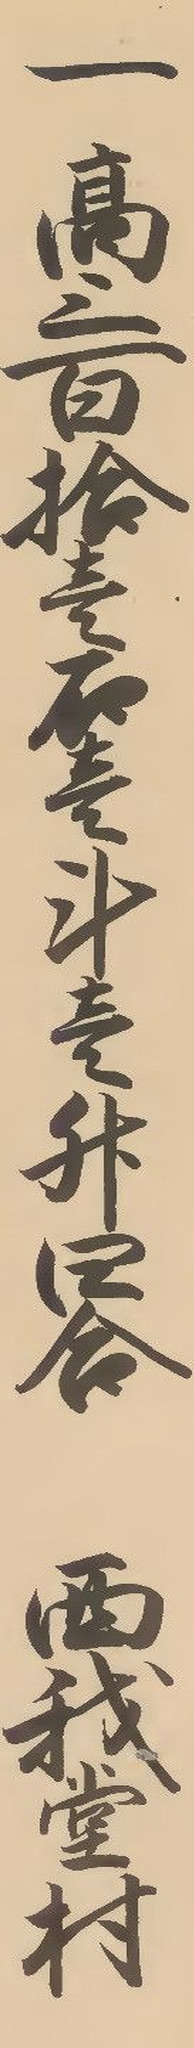一高三百拾壱石壱斗壱升四合西我堂村
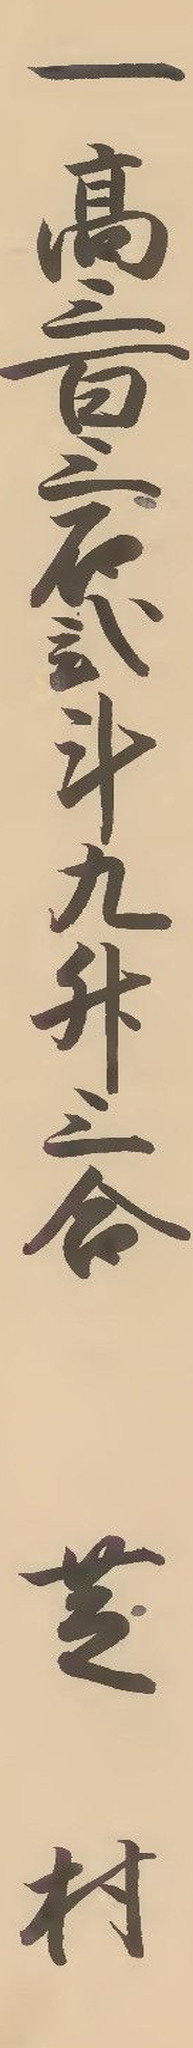一高三百三石弐斗九升三合芝村

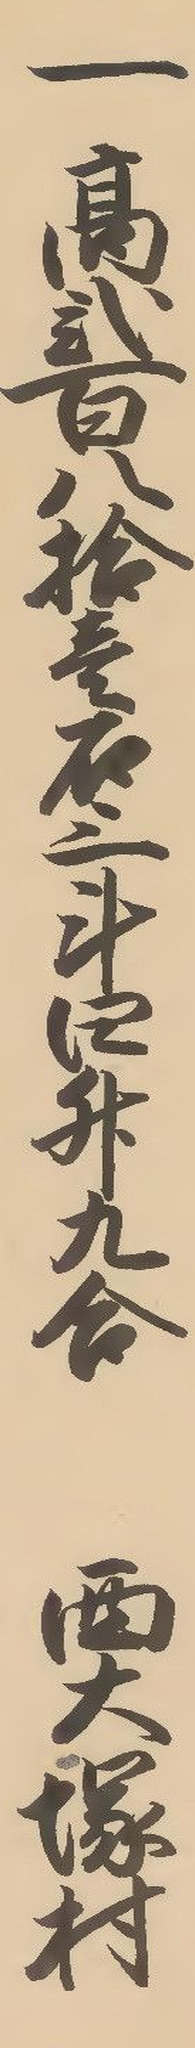一高弐百八拾壱石三斗四升九合西大塚村
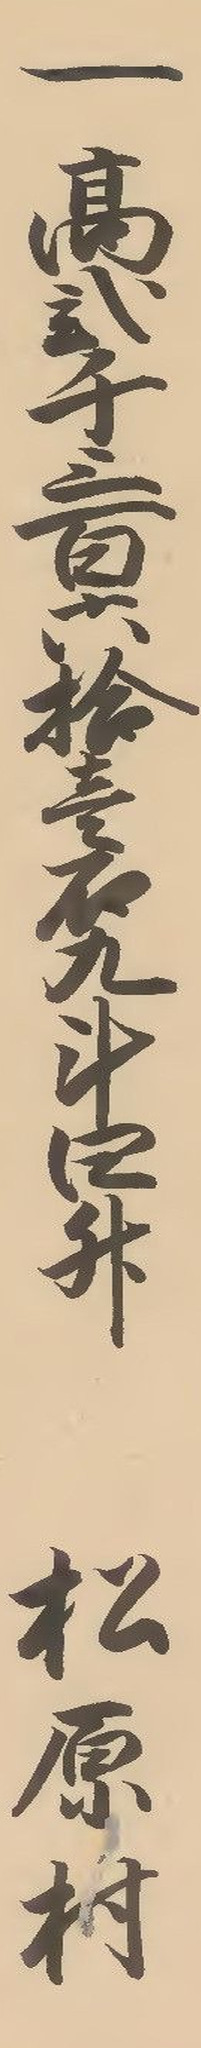一高弐千三百六拾壱石九斗四升松原村
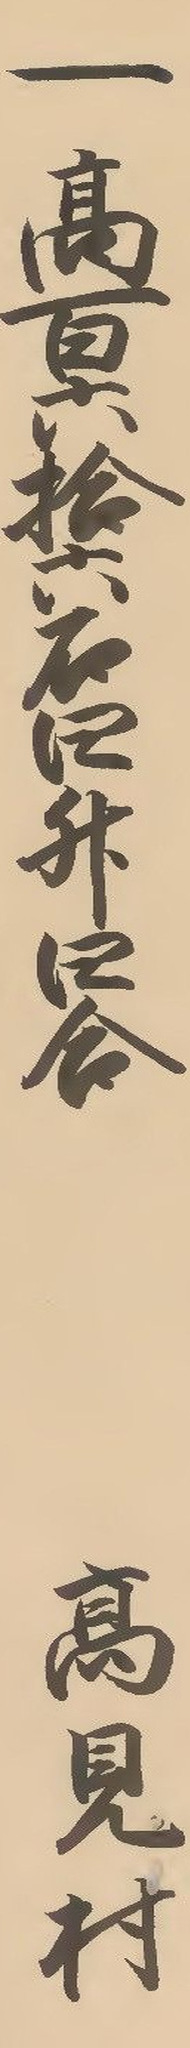一高百六拾六石四升四合高見村
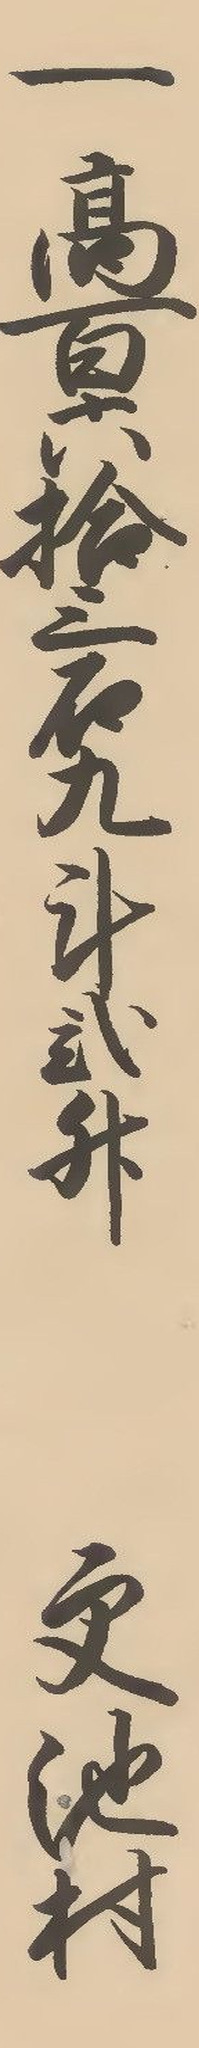一高百六拾三石九斗弐升更池村
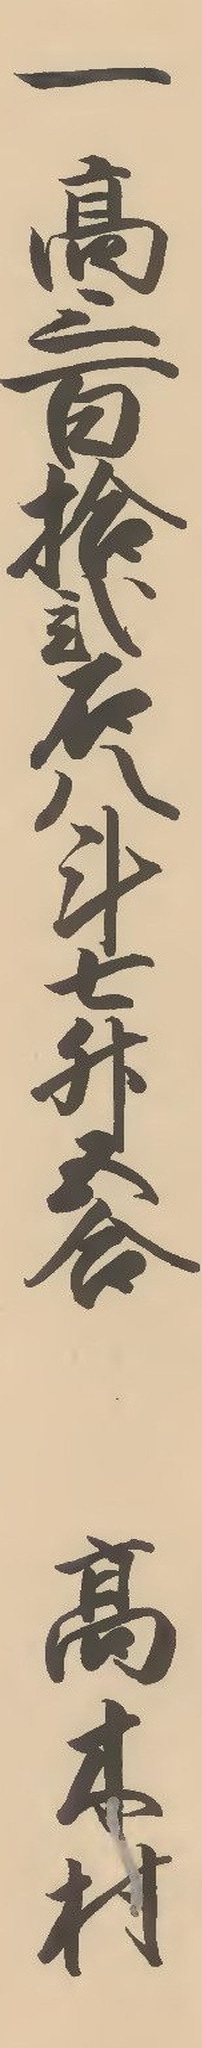一高三百拾弐石八斗七升五合高木村
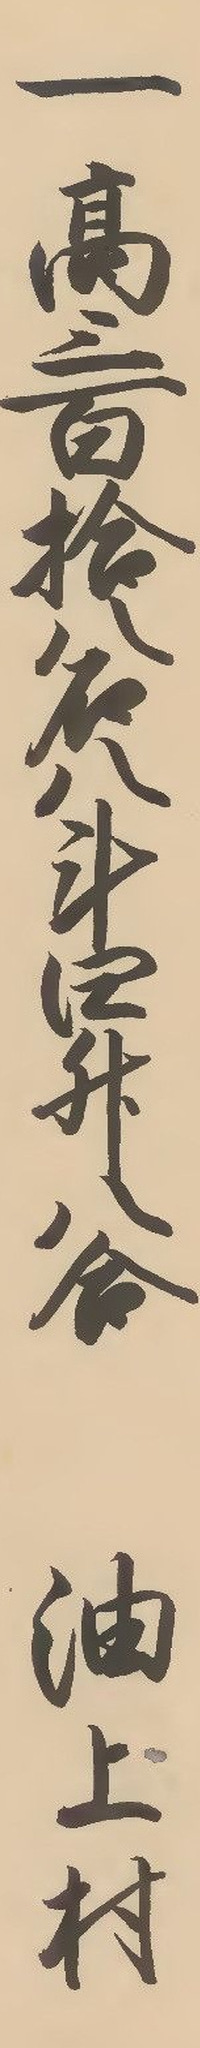一高三百拾八石八斗四升八合油上村
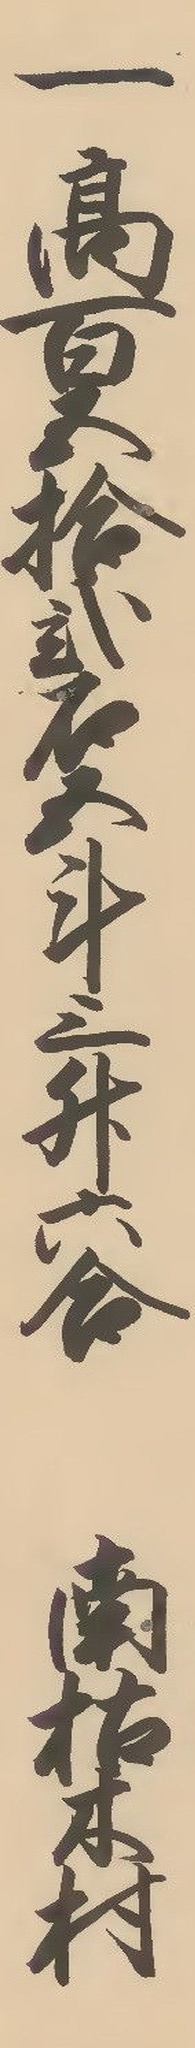一高百五拾弐石五斗三升六合南枯木村

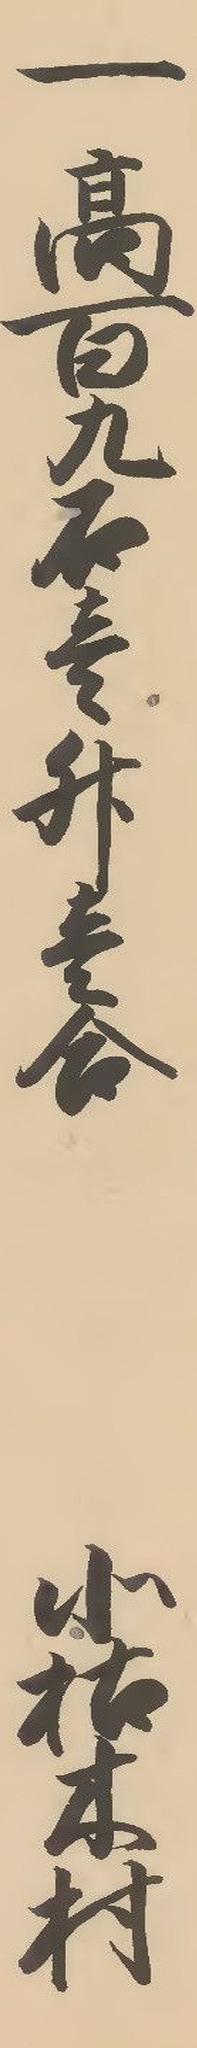一高百九石壱升壱合北枯木村
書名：河内国郷帳
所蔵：国立公文書館 National Archives of Japan
